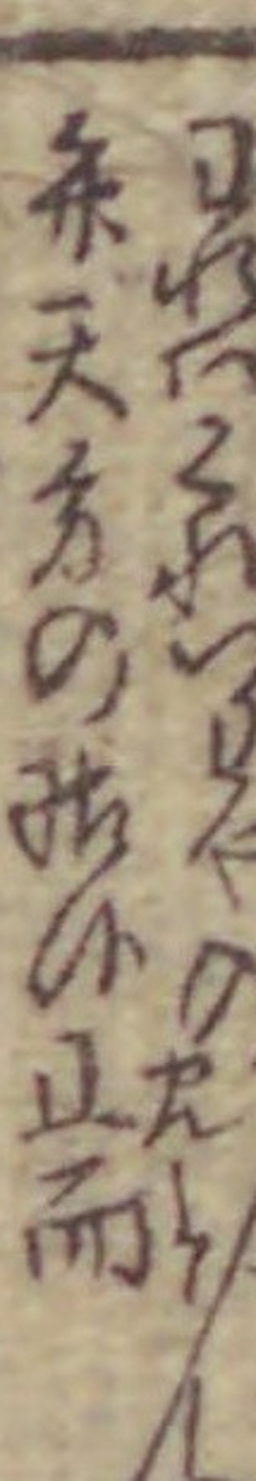弁天方の居候止而
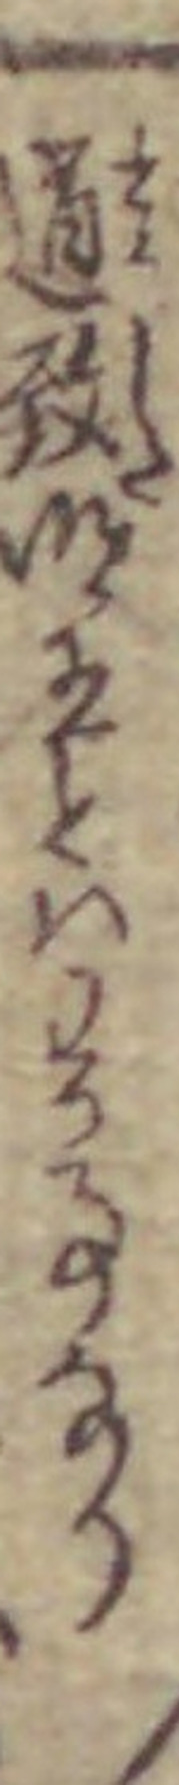道致明王とはわか事なり
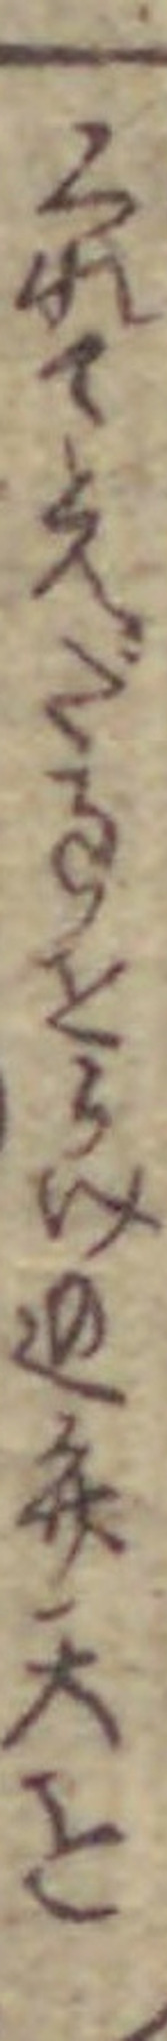くれてとんだ事をうけ込弁天を
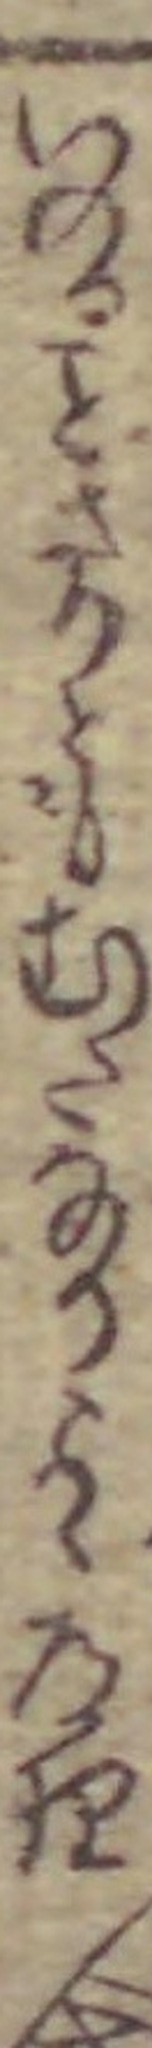いのることさりともむたなりとかく道理
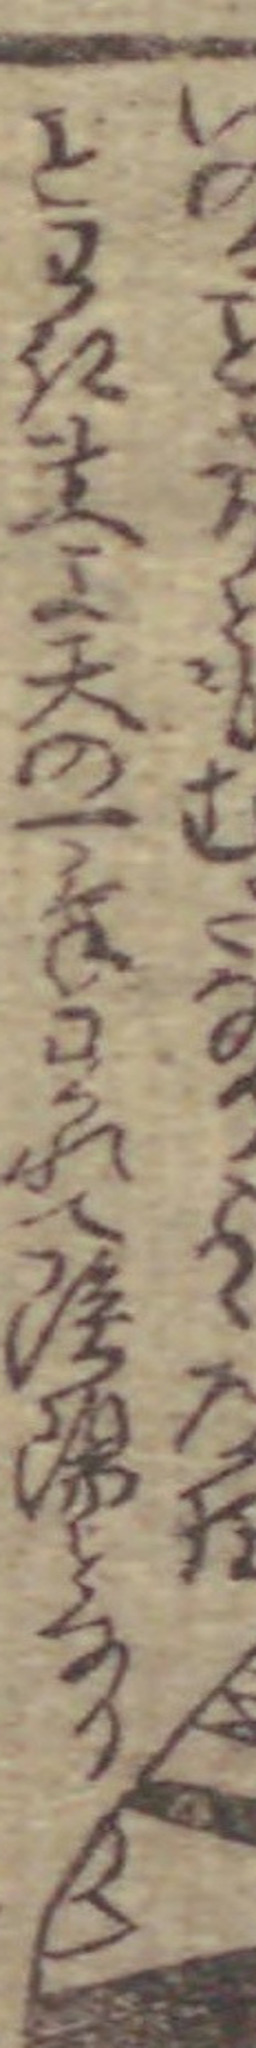をわきまへよ天の一気わかれて陰陽となり
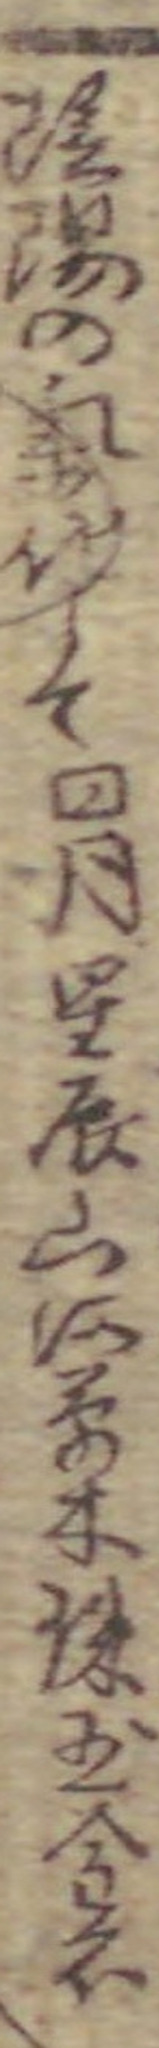陰陽の気化して日月星辰山河草木珠玉金衣
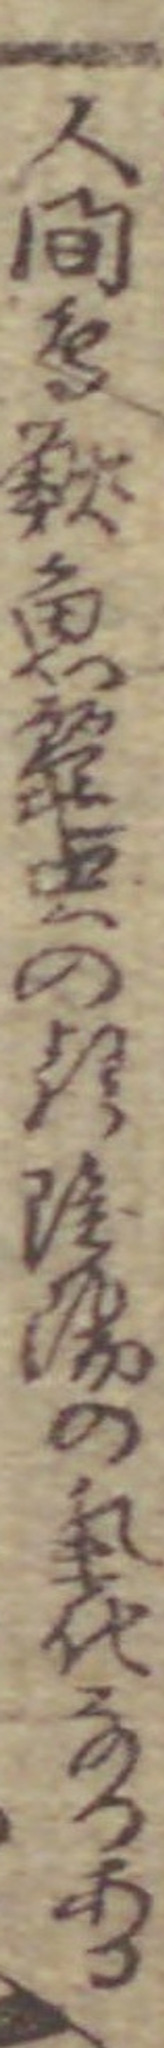人間鳥獣魚亀虫の類陰陽の気化なりある
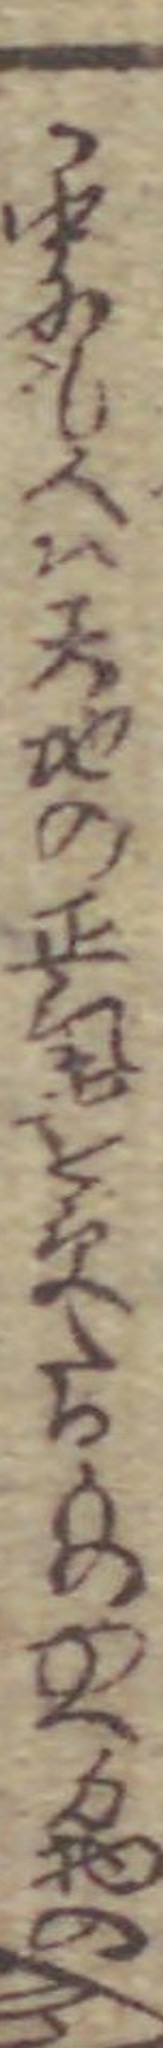か中にも人は天地の正気を受たるものゆへ万物の
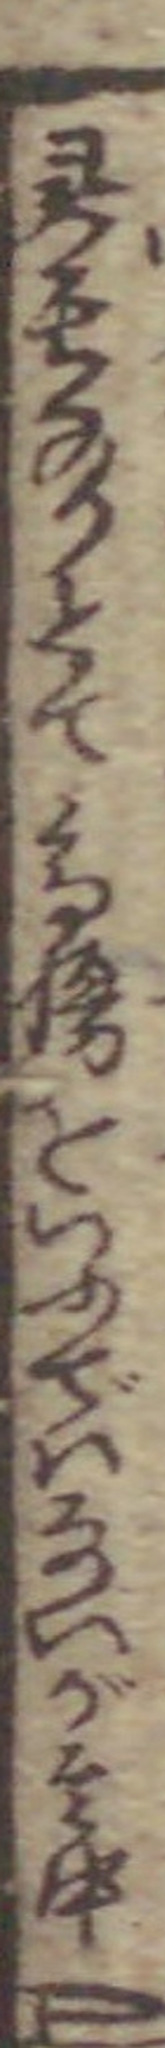霊長なりとて高勝といふではないが其中
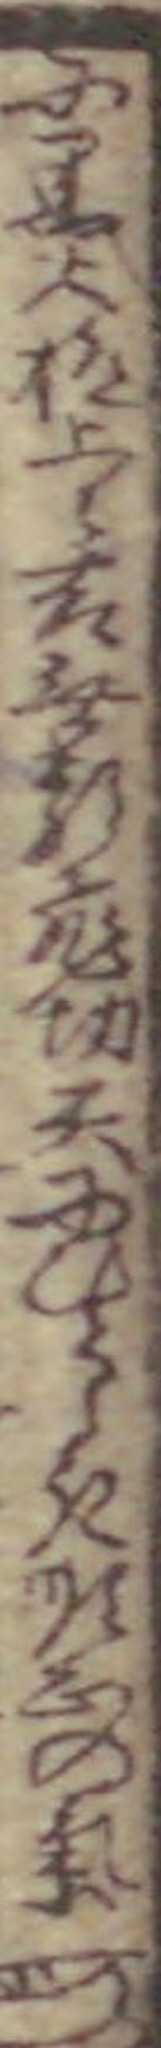に黒大極上々吉無類飛切天にひとしき順正の気
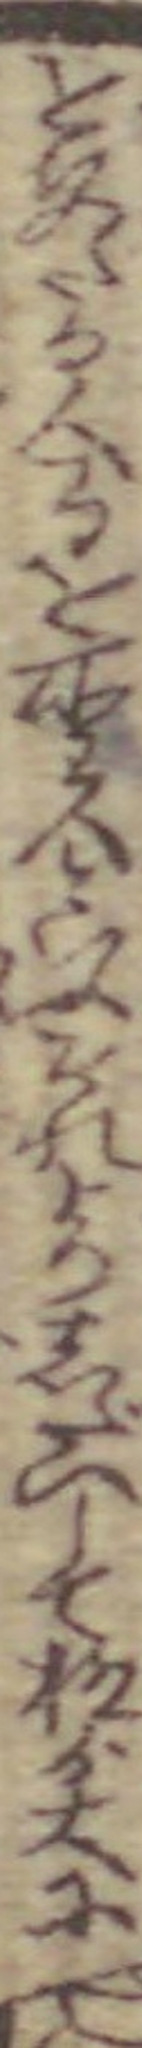を受たる人間を聖人といふこれよりしだいして極より大に
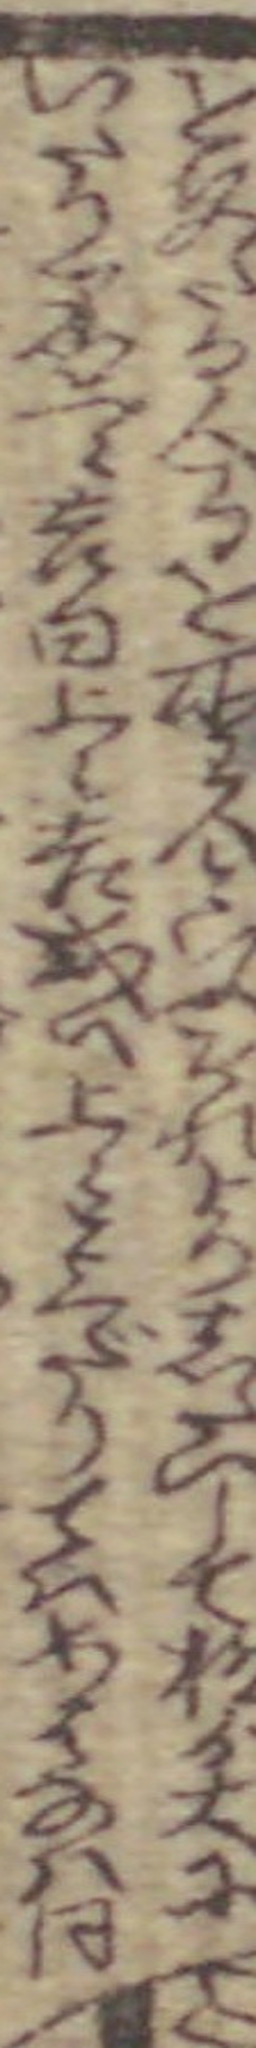いたり黒上々吉白上々吉或は上々くだりてはめはなは同
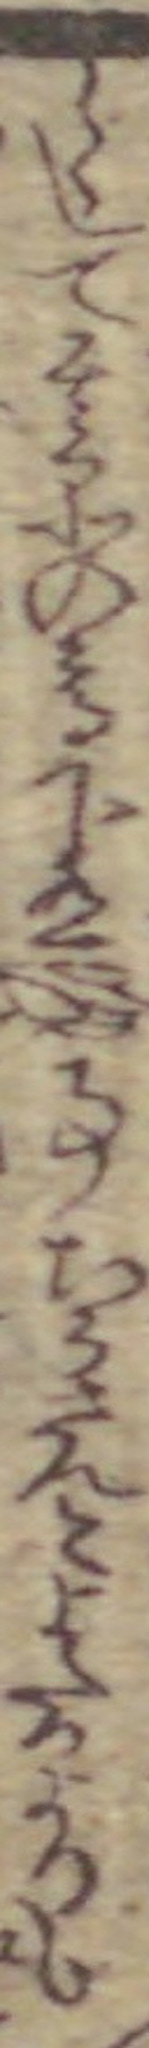しくして其品の高下有事ちうさんとにたりよるも
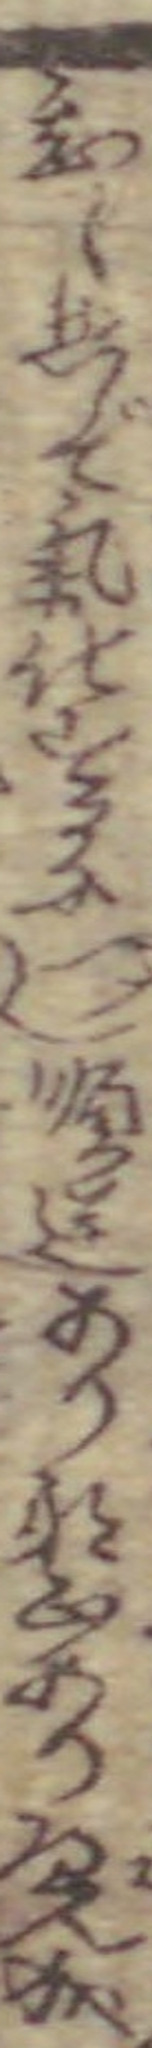甚し惣じて気化するに順送りあり邪正ありへん成
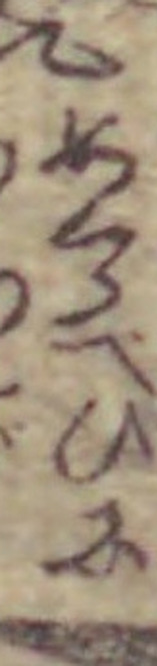めくらへびに
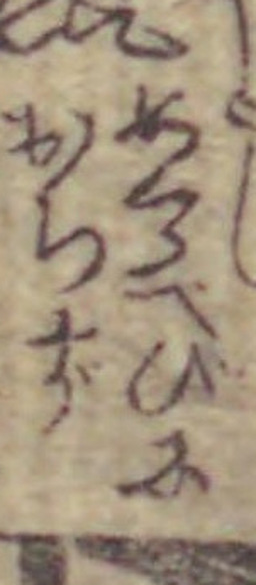おちず
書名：止而道致虚録 3巻
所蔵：国立国会図書館 National Diet Library, JAPAN
